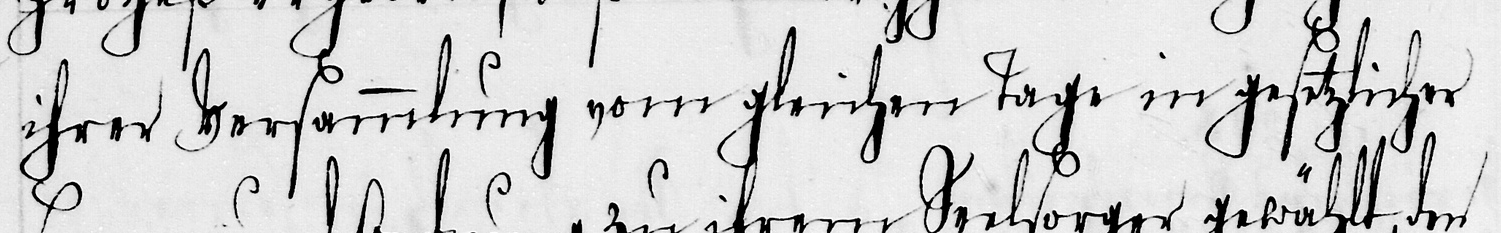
ihrer Versammlung vom gleichen Tage in gesetzlicher
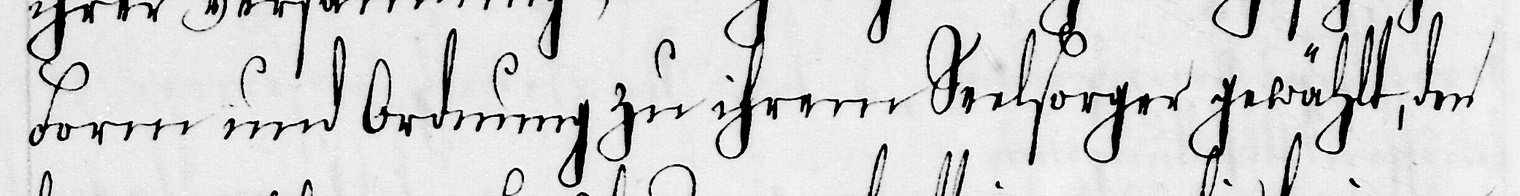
Form und Ordnung zu ihrem Seelsorger gewählt, den
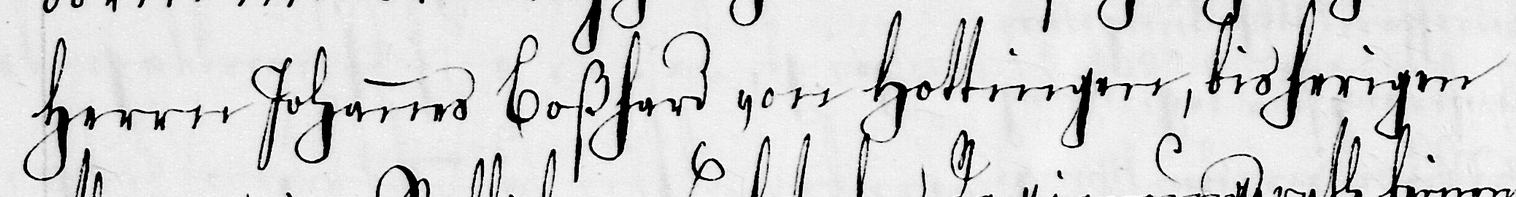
Herrn Johannes Boßhard von Hottingen, bisherigen
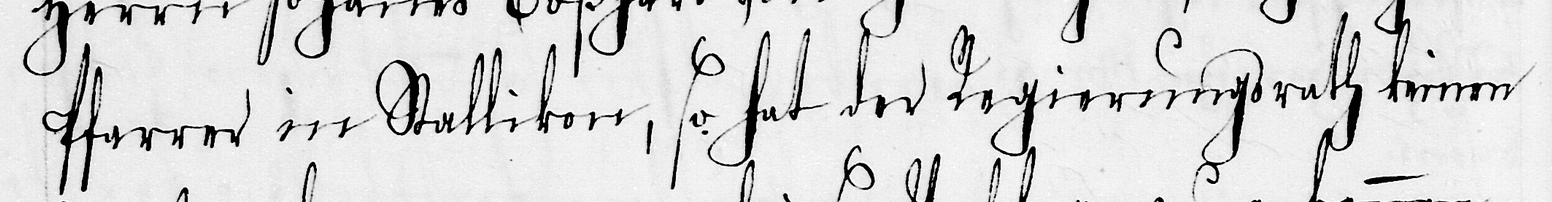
Pfarrer in Stallikon, so hat der Regierungsrath keinen
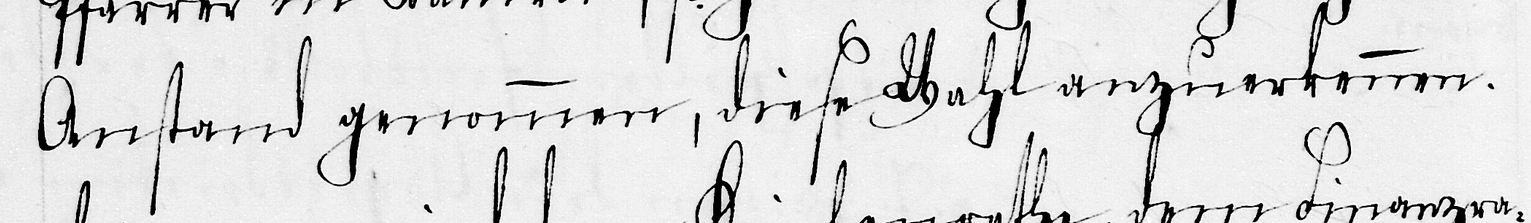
Anstand genommen, diese Wahl anzuerkennen.
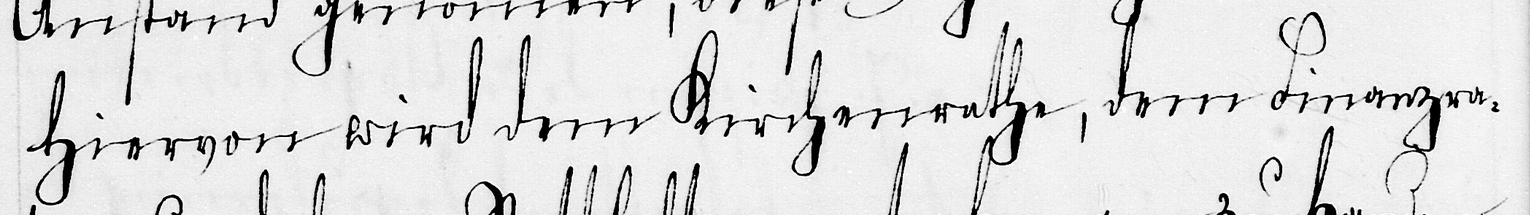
Hiervon wird dem Kirchenrathe, dem Finanzra¬
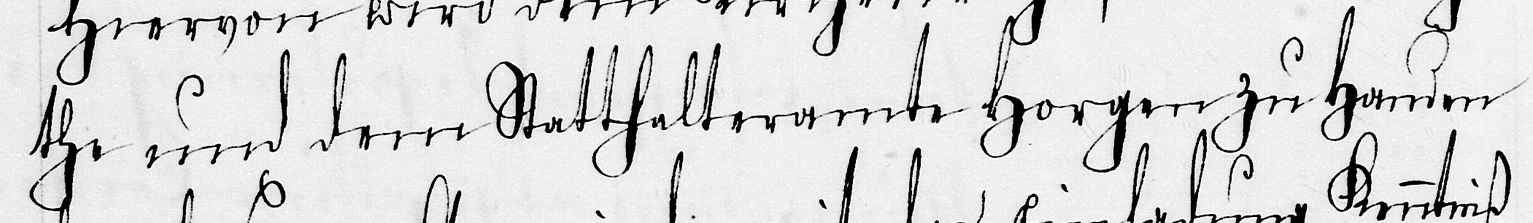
the und dem Statthalteramte Horgen zu Handen
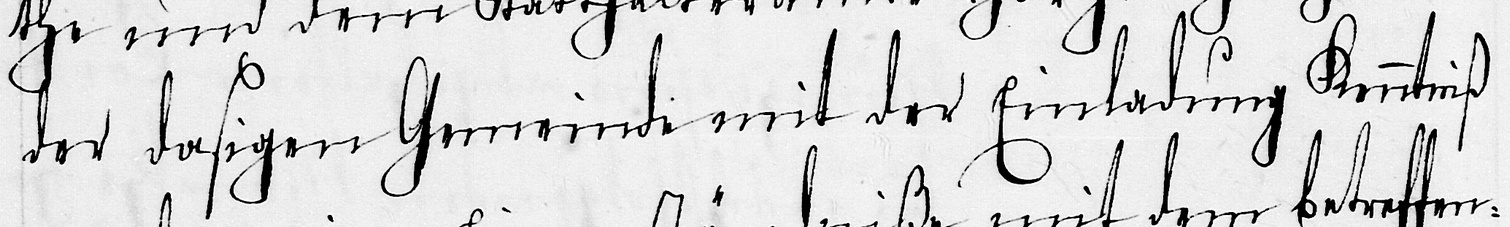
der dasigen Gemeinde mit der Einladung Kenntniß
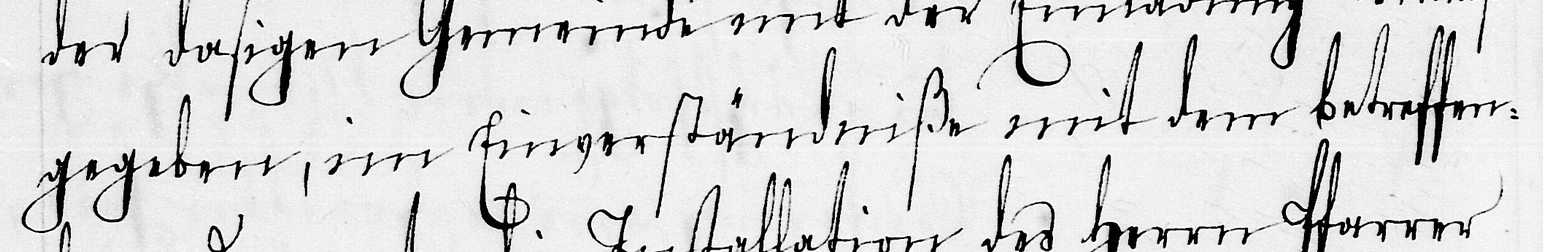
gegeben, im Einverständniße mit dem betreffe¬
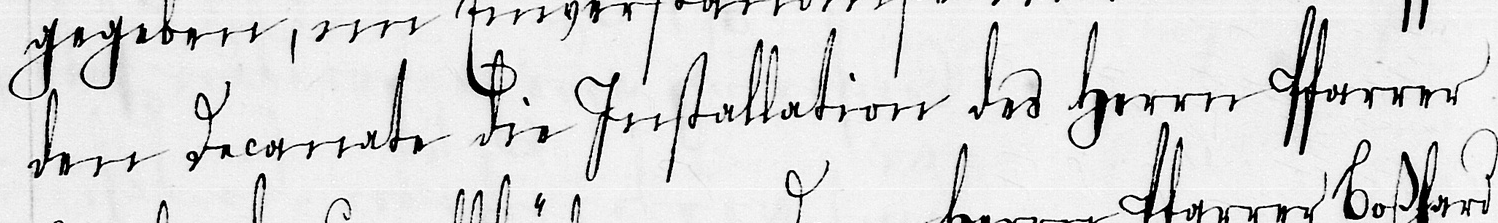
nden Decanate die Installation des Herrn Pfarrer
